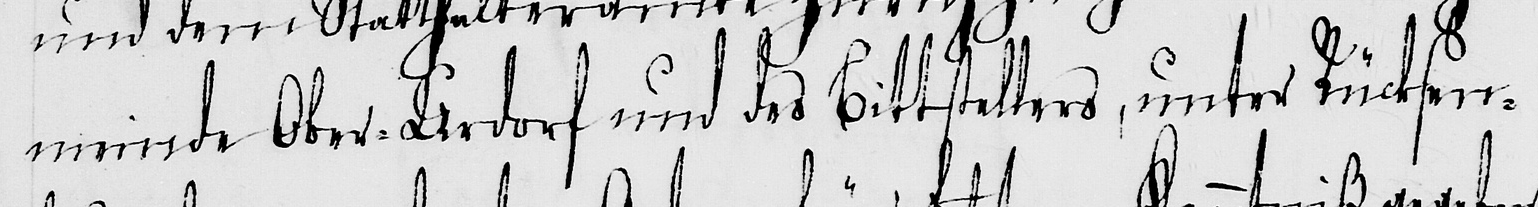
meinde Ober-Urdorf und des Bittstellers, unter Rücksen¬
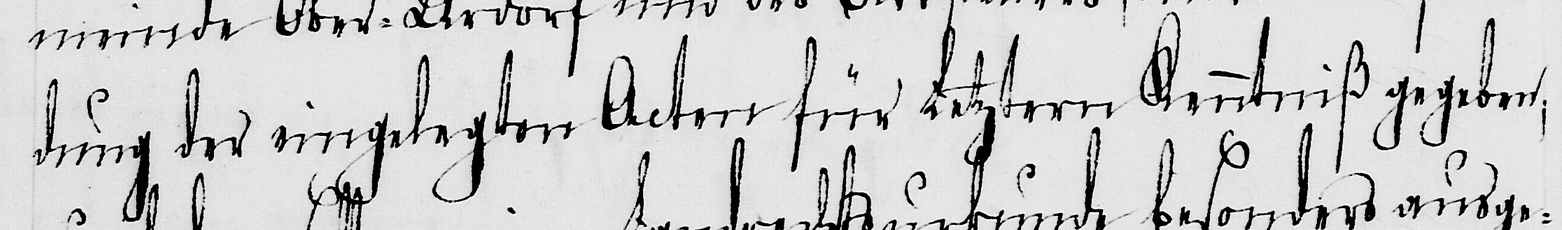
dung der eingelegten Acten für Letztern Kenntniß gegeben;
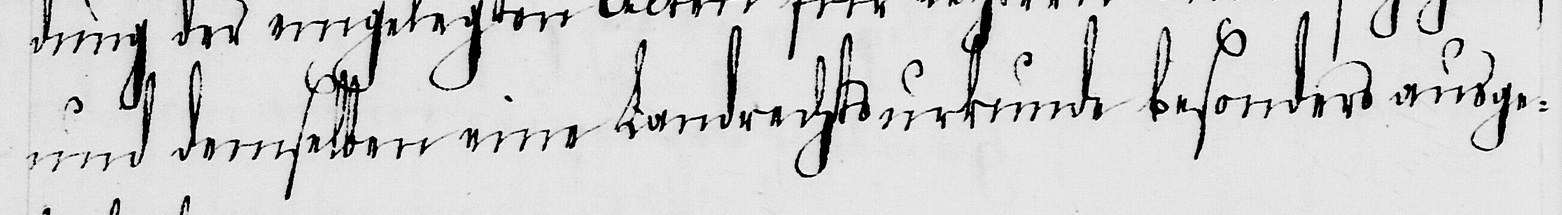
und demselben eine Landrechtsurkunde besonders ausge¬
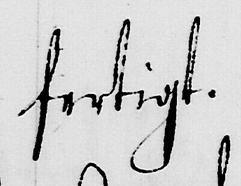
fertigt.
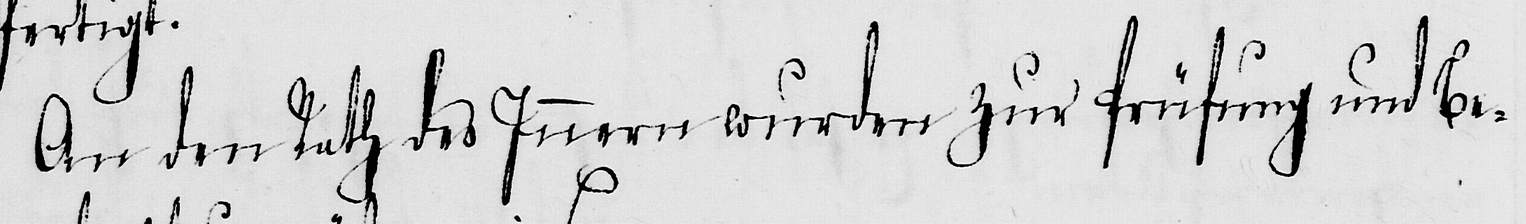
An den Rath des Innern wurden zur Prüfung und Be¬
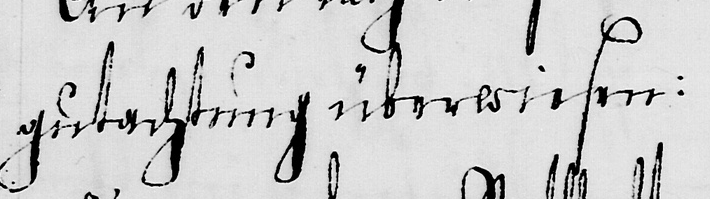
gutachtung überwiesen:
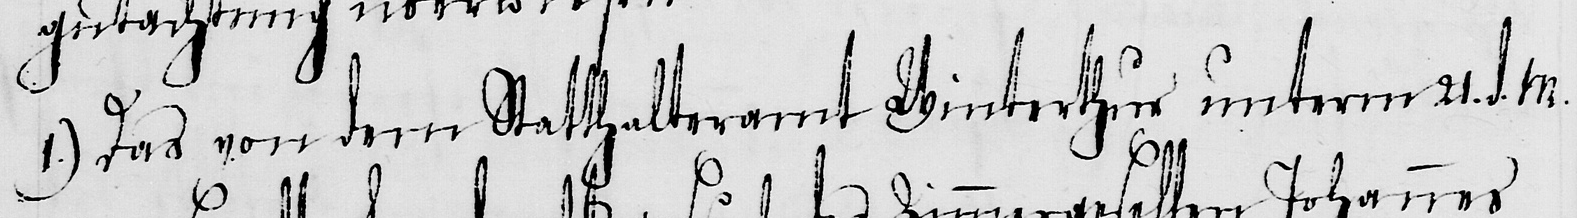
1.) Das von dem Statthalteramt Winterthur unterm 21. d.
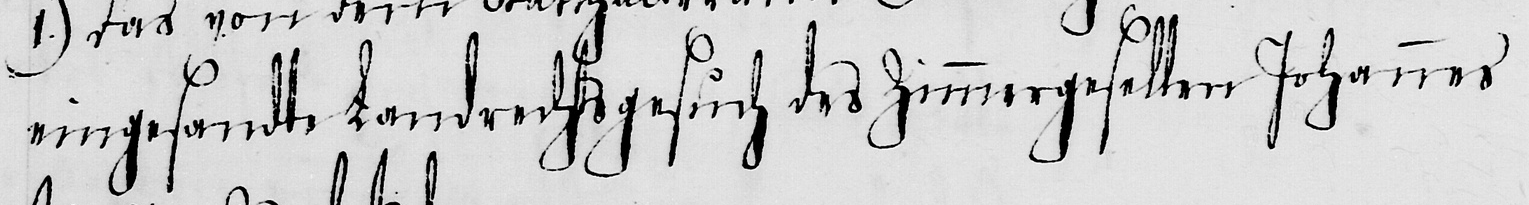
eingesandte Landrechtsgesuch des Zimmergesellen Johannes
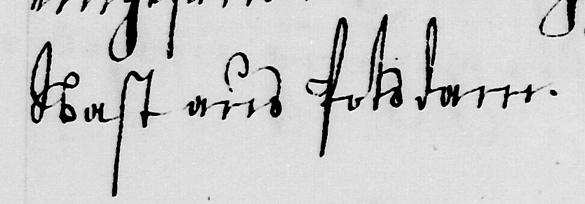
Nast aus Potsdam.
